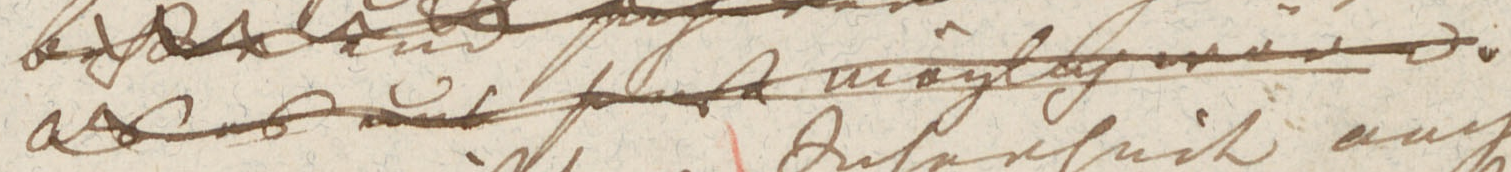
als es uns sonst möglich wäre.
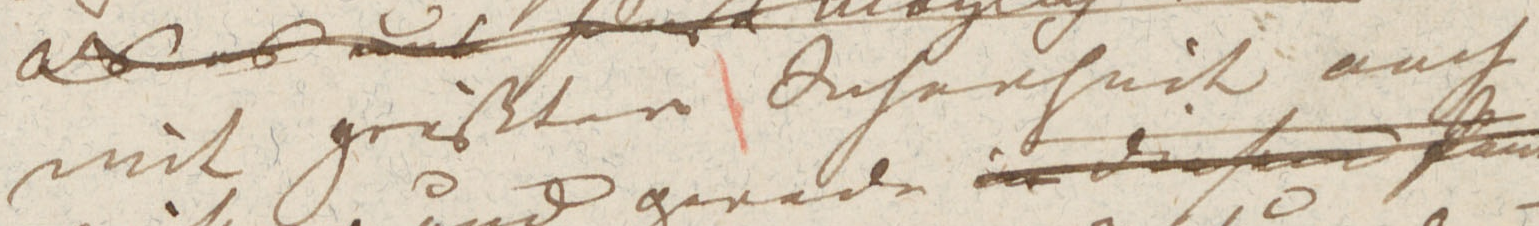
mit grösster % Sicherheit nach-
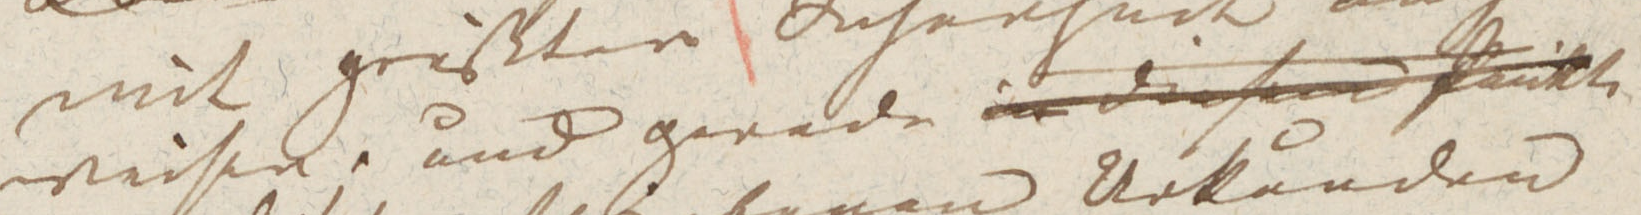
weisen; und gerade in diesem Punkte
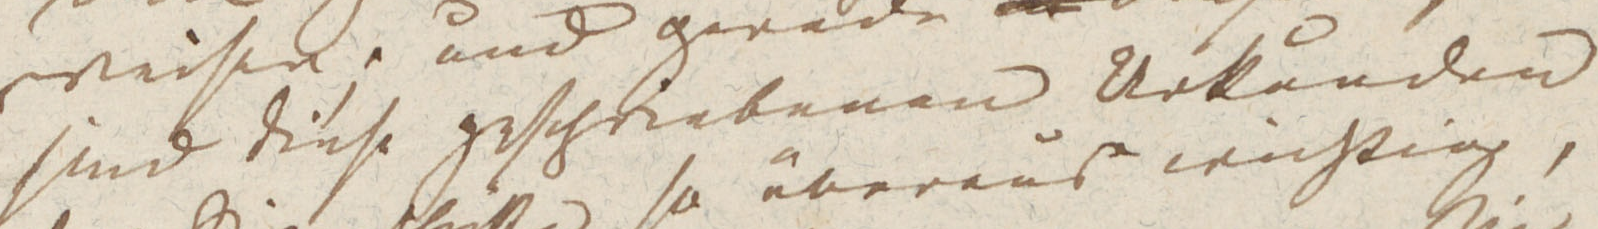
sind diese geschriebenen Urkunden
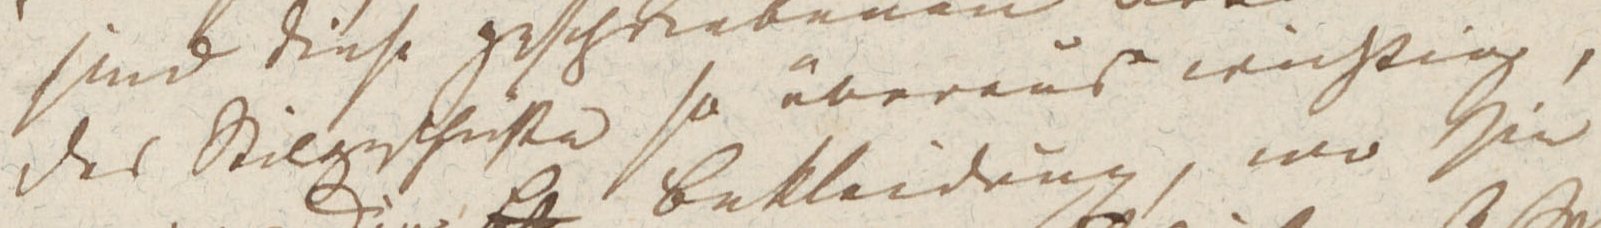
der Stilgeschichte so überaus wichtig,
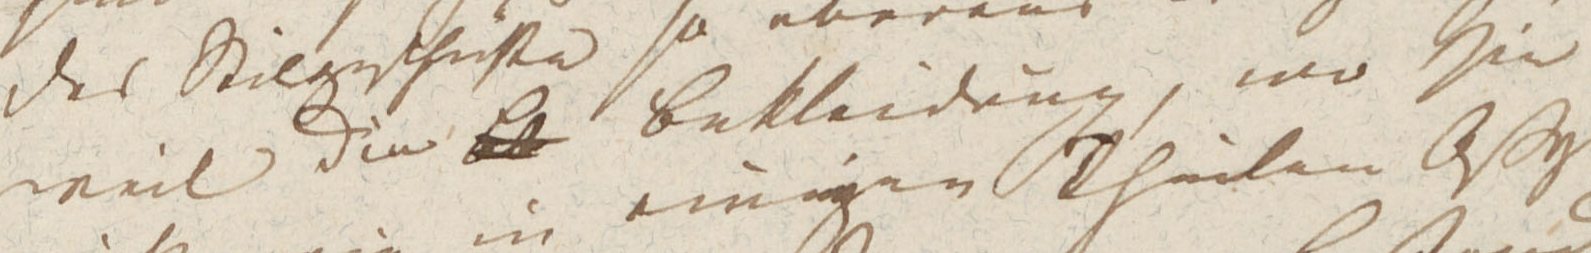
weil die Bl Bekleidung, wo sie
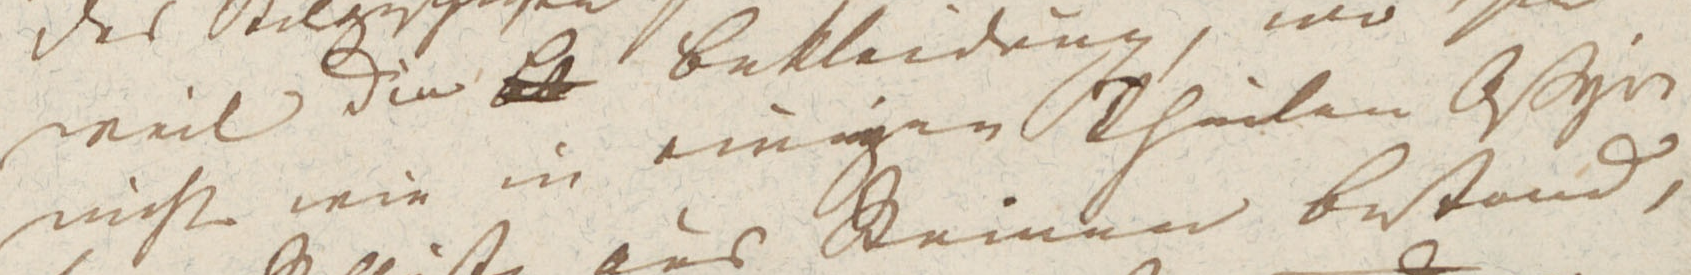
nicht wie in einigen Theilen Assyri
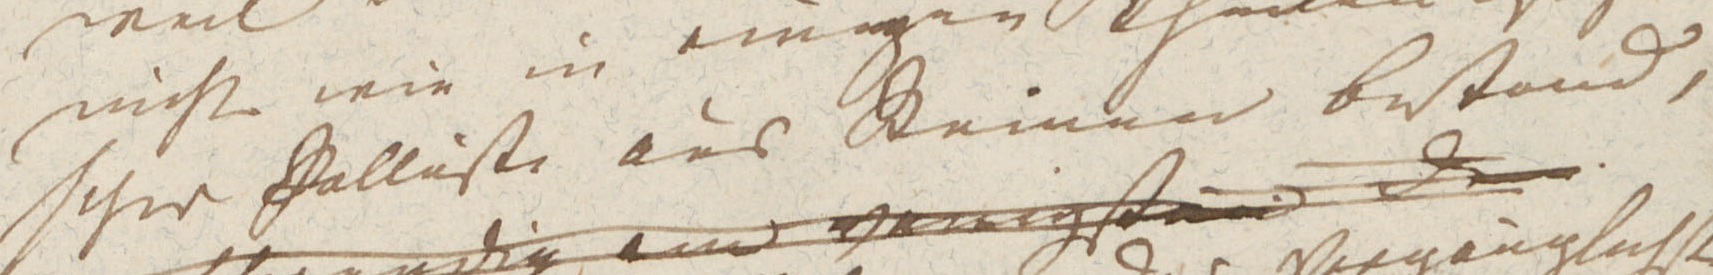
scher Palläste aus Steinen bestand,
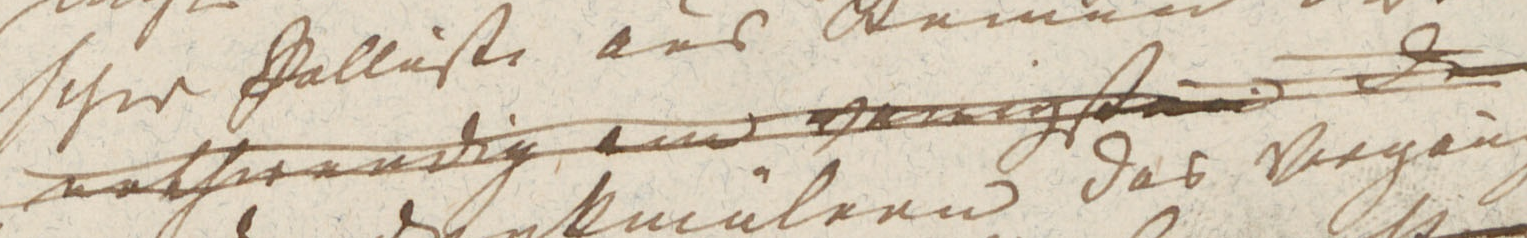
nothwendig am wenigsten de
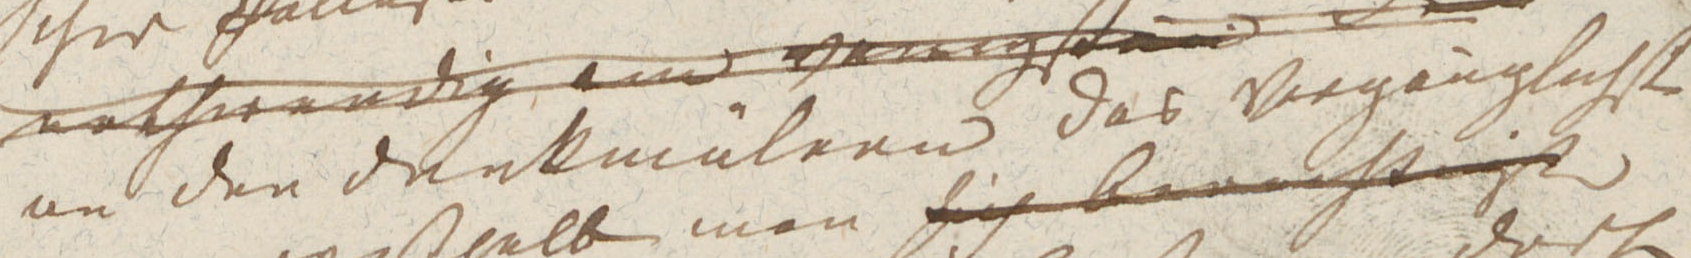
an den Denkmälern das Vergänglichst
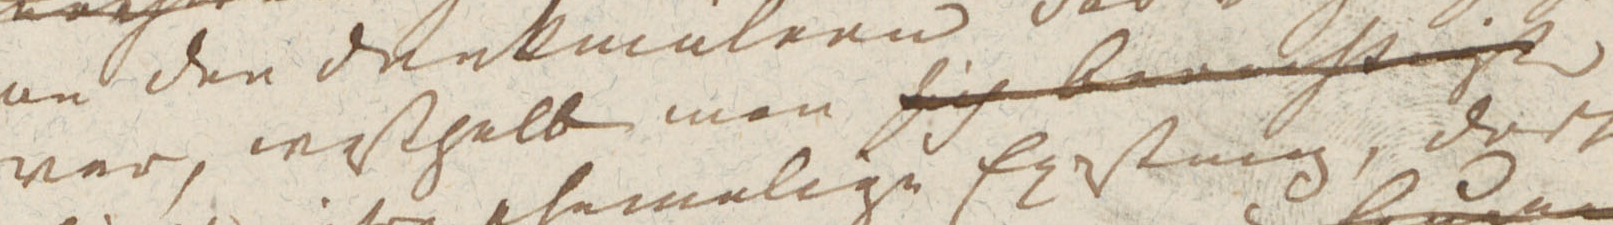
war, wesshalb man sich berechtigt
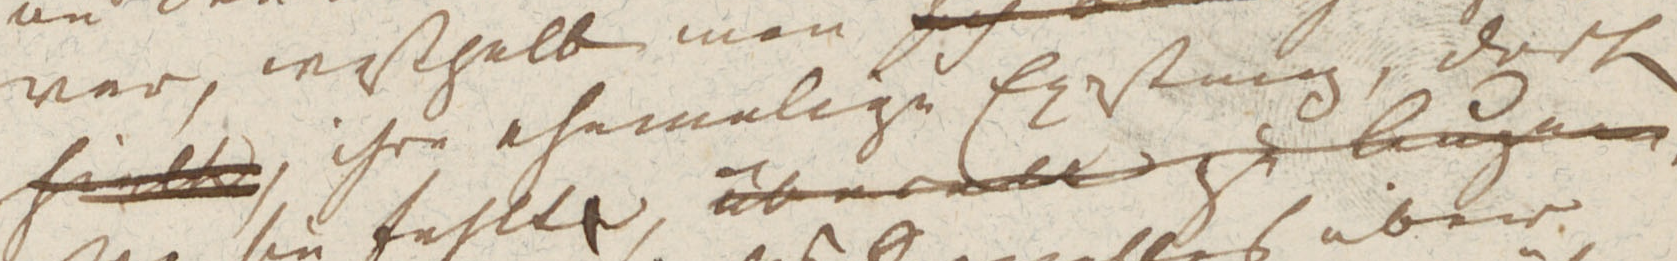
hielt, ihre ehemalige Existenz, dort
